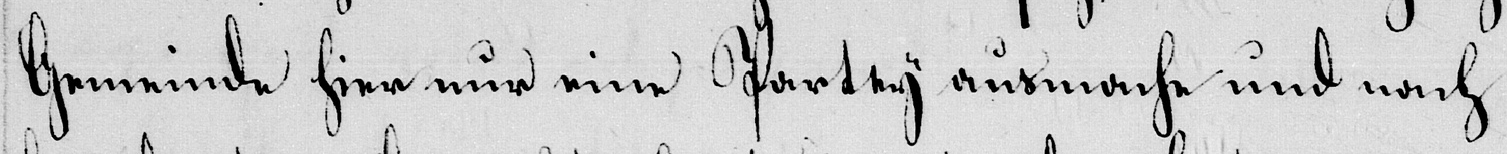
Gemeinde hier nur eine Partey ausmache und nach
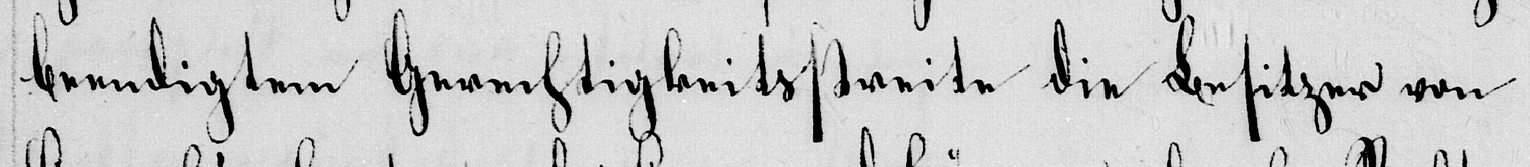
beendigtem Gerechtigkeitsstreite die Besitzer von
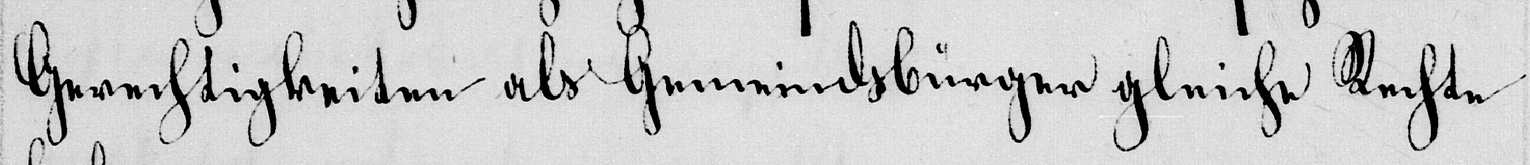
Gerechtigkeiten als Gemeindsbürger gleiche Rechte
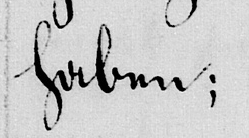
haben;
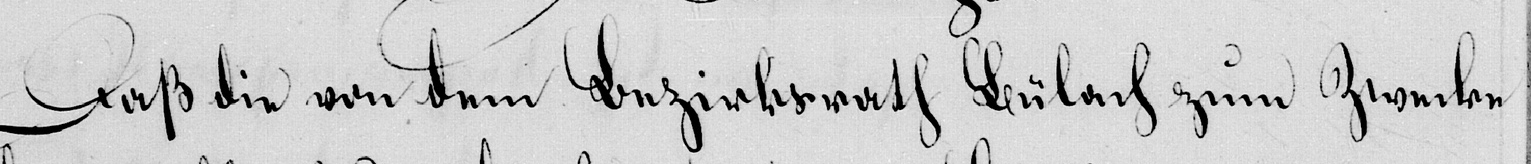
Daß die von dem Bezirksrath Bülach zu Zwecken
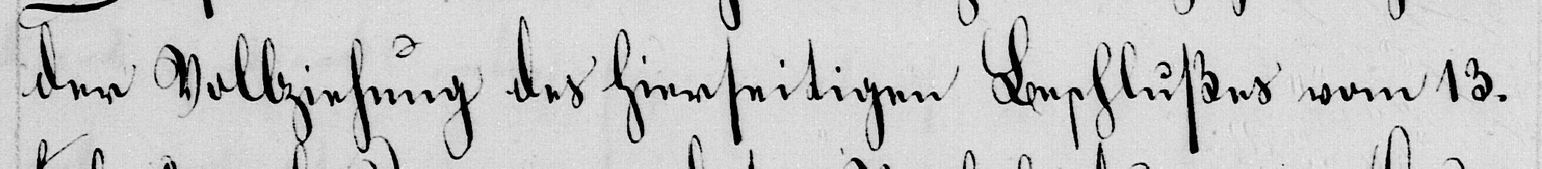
der Vollziehung des hierseitigen Beschlußes vom 13.
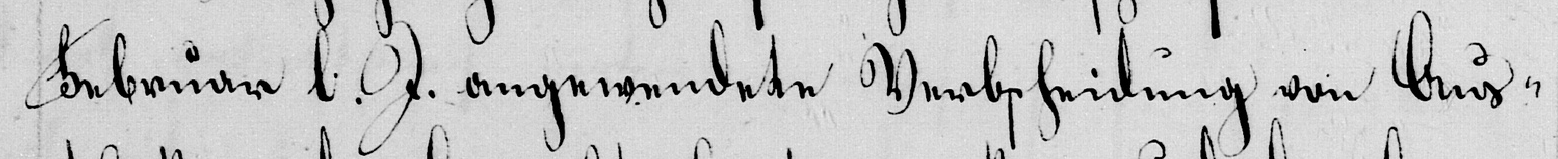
Februar l. J. angewendete Verbscheidung von Aus¬
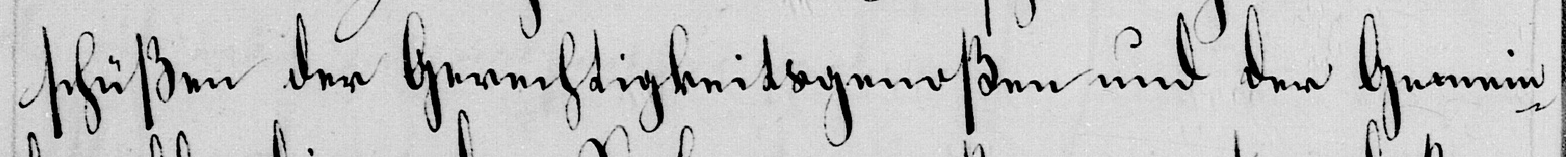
schüßen der Gerechtigkeitsgenoßen und der Gemein¬
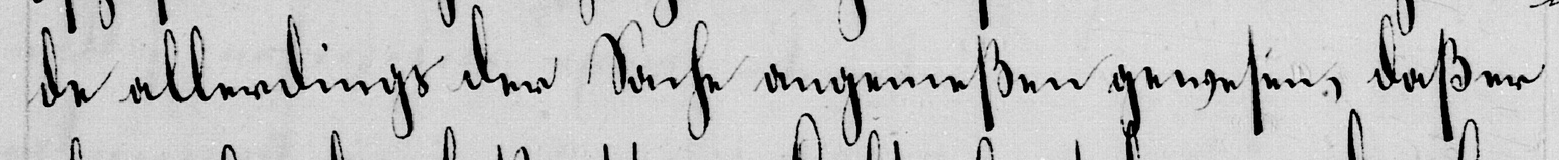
de allerdings der Sache angemeßen gewesen, daß er
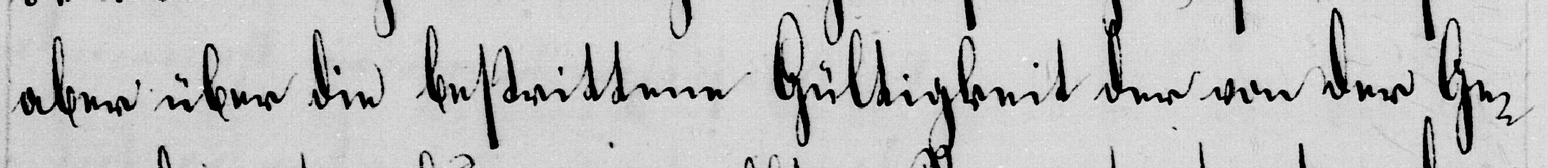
aber über die bestrittene Gültigkeit der von der Ge¬
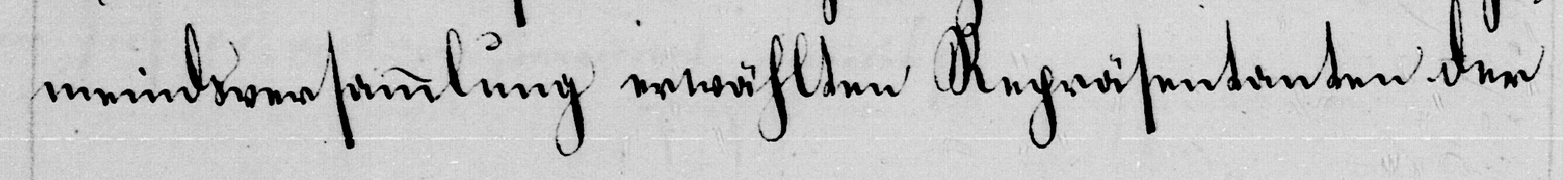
meindsversammlung erwählten Repräsentanten der
